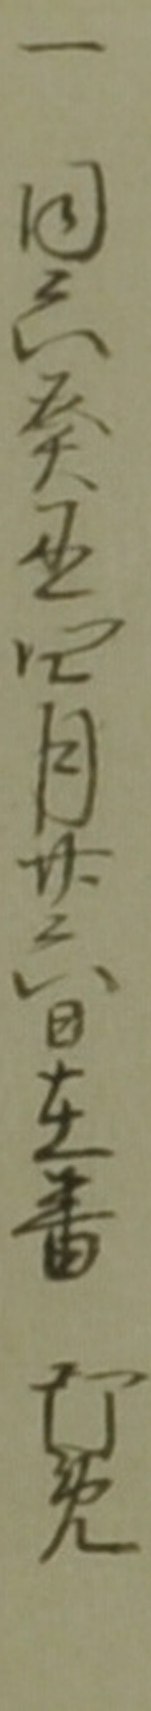一同六癸丑四月廿六日在番御免
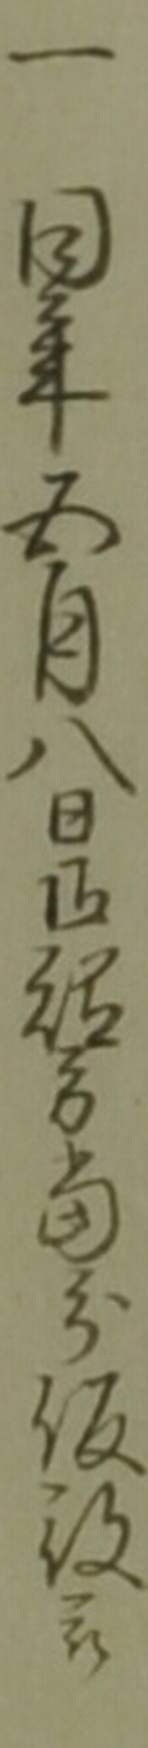一同年五月八日御賄方当分仮役被仰付
